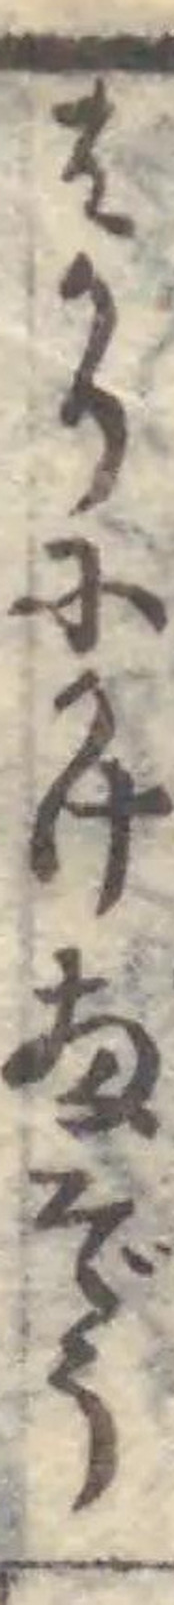はかりにかけ扨ぞう
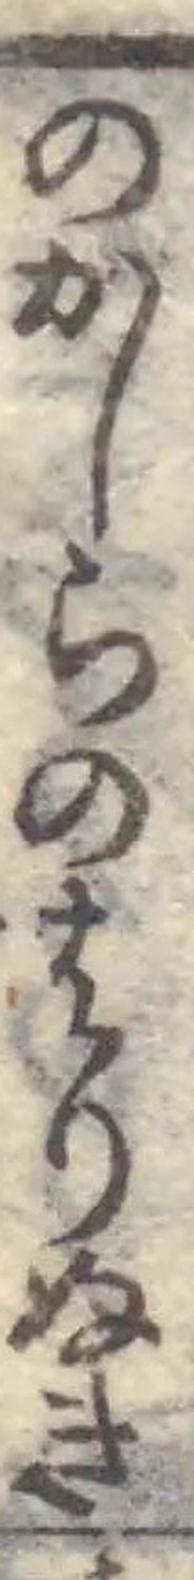のかしらのはりぬき
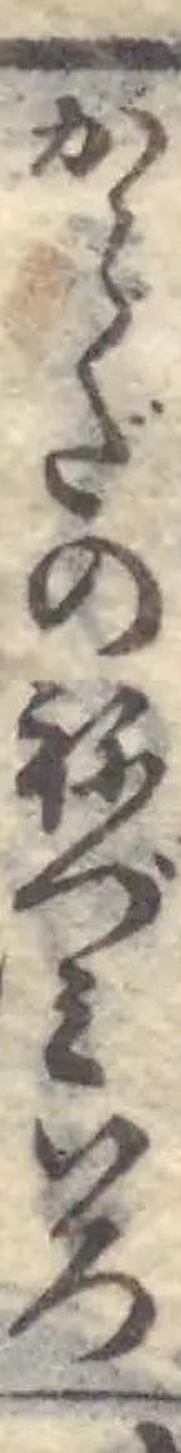からだのねづみいろ
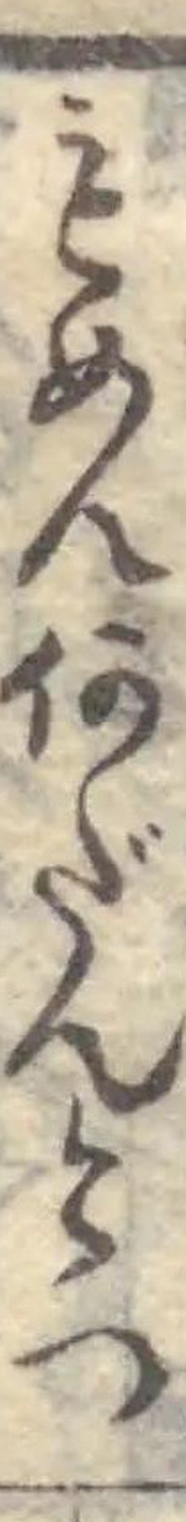もめん何だんとつ
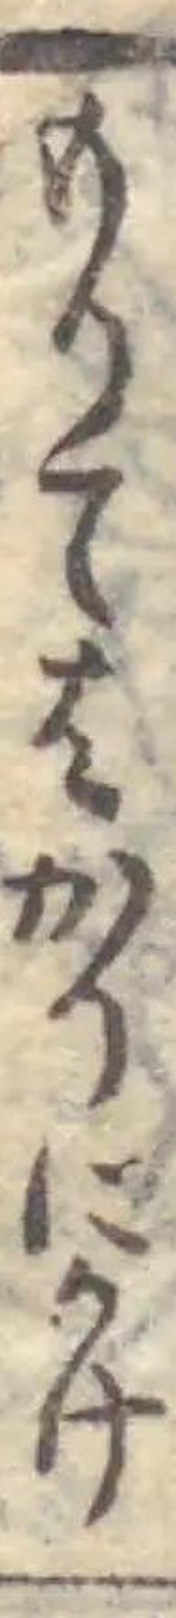もりてはかりにかけ
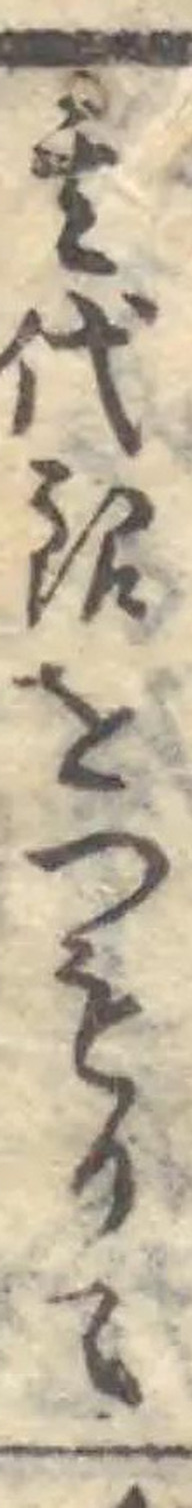其代銀をつもりて
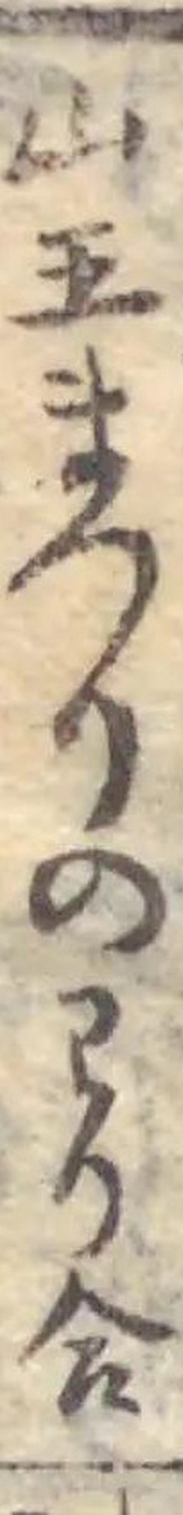山王まつりのわり合
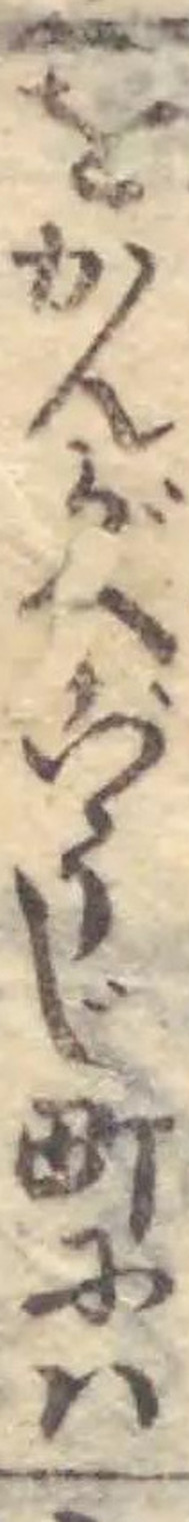をかんがへこうじ町には
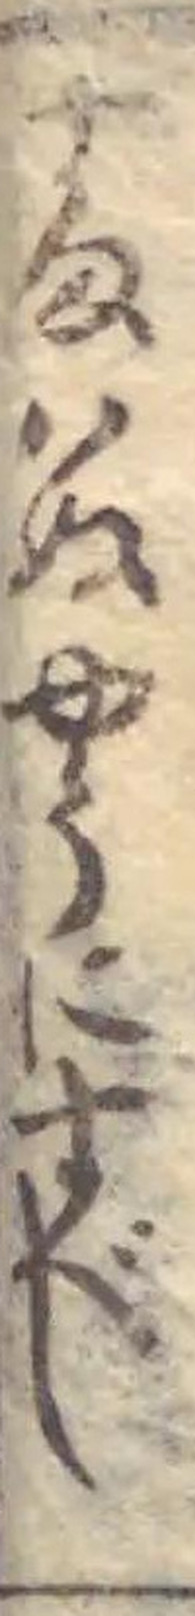すまはぬやうにすべし
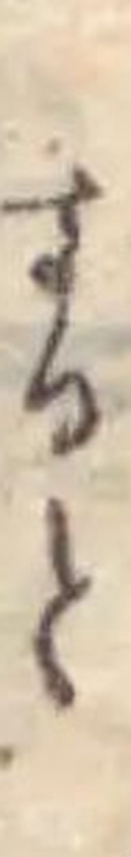すると
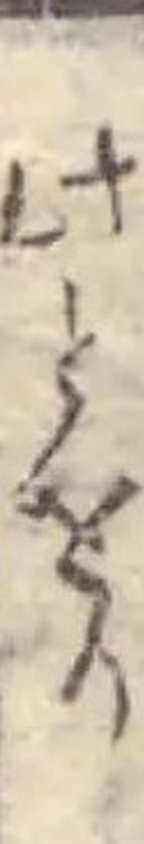此とをり
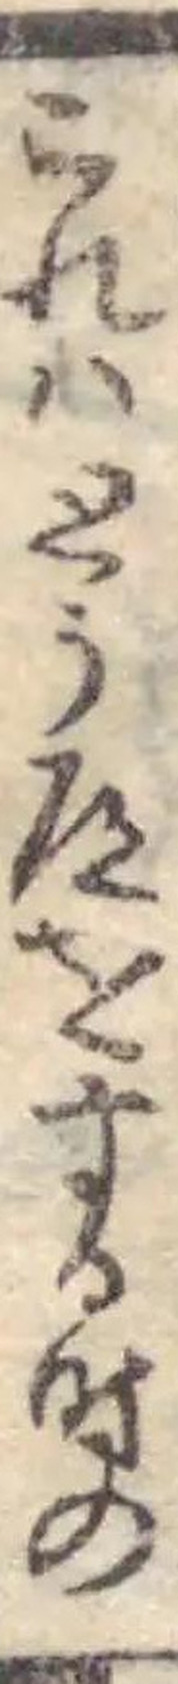これはとう道をする時の
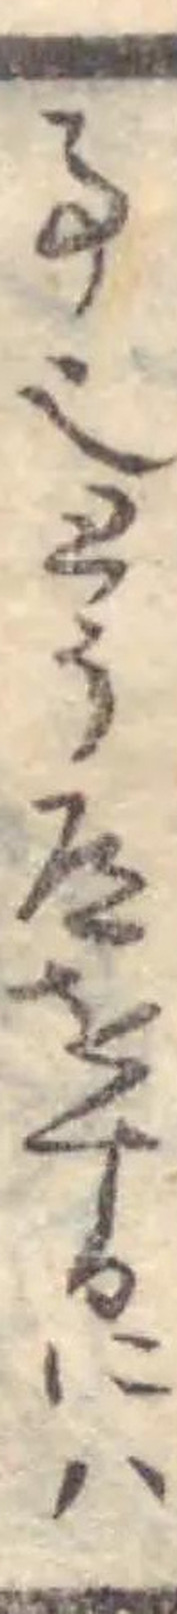事也とう道をするには
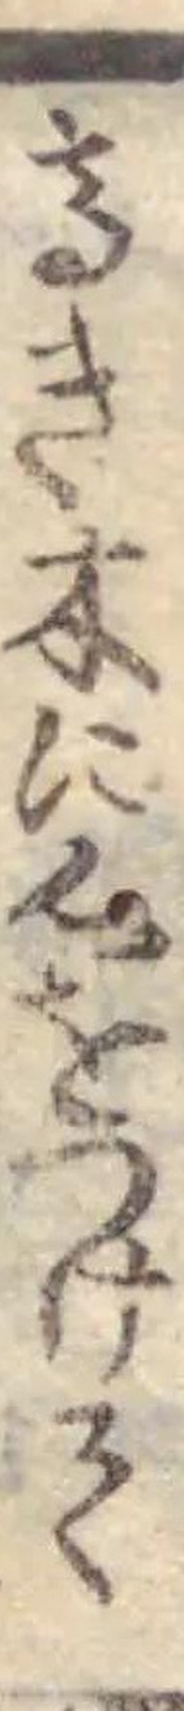高き木に心をつけて
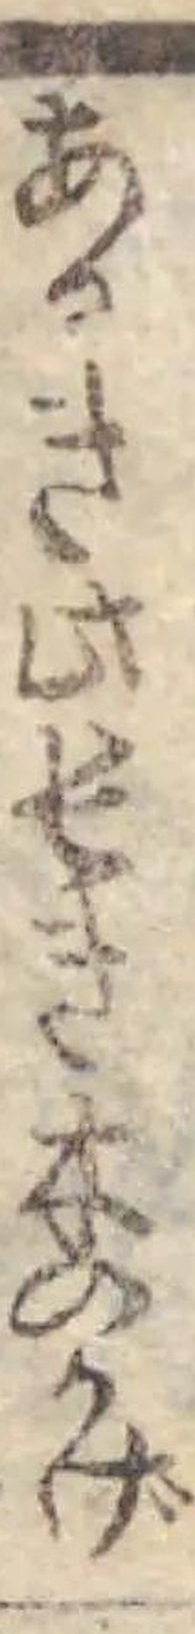あるき此長き木のかげ
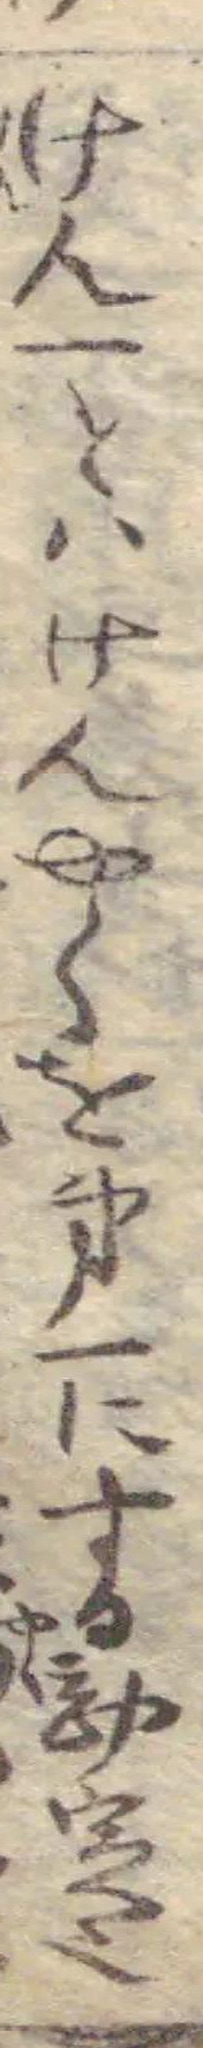けん一とはけんやくを第一にする勘定也
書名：大通人好記
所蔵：国立国会図書館 National Diet Library, JAPAN
